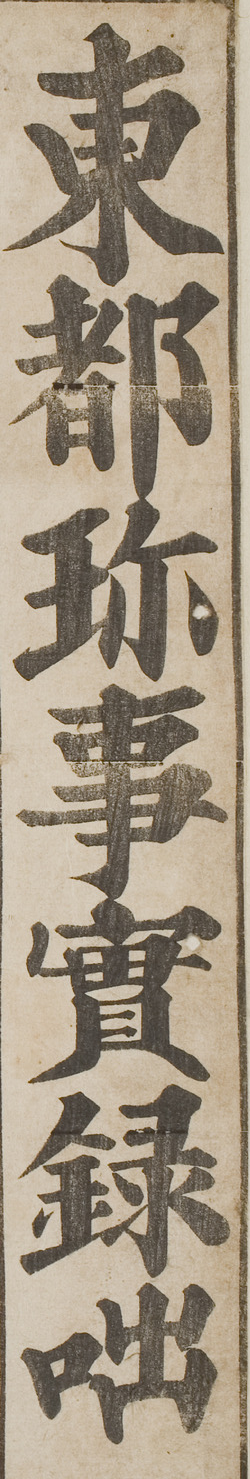東都珎事実録咄
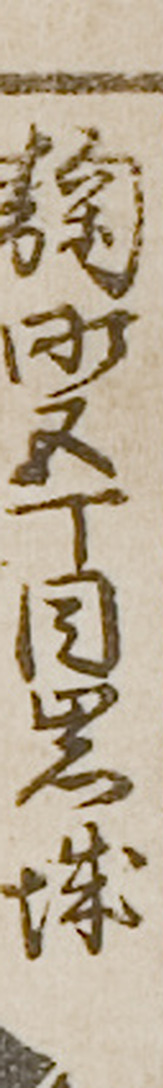麹町五丁目岩城
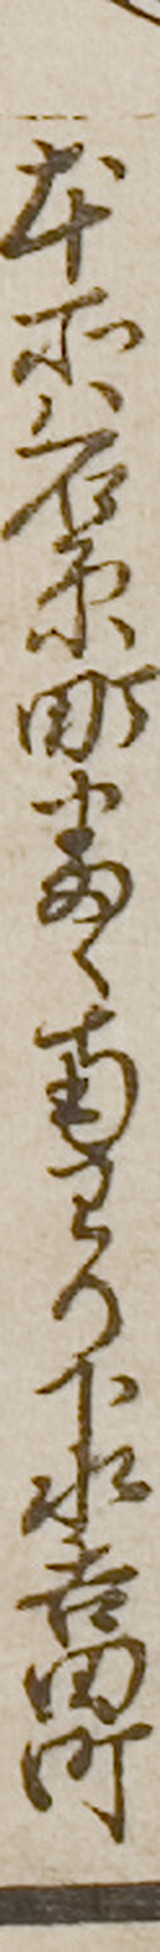本所は石原町番く南わり下水吉田町
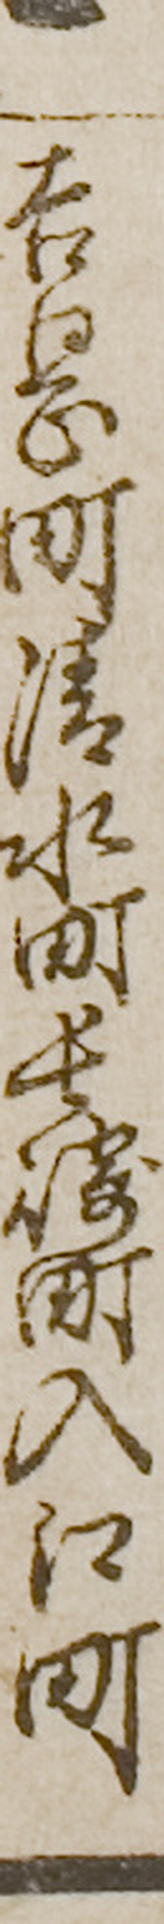吉岡町清水町長崎町入江町
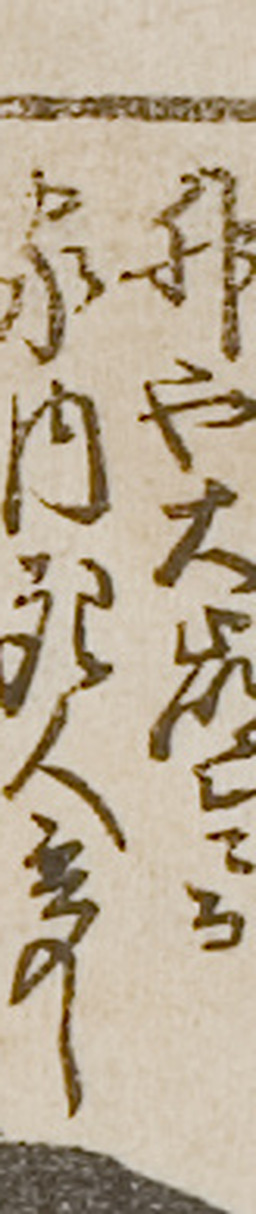家内死人多し
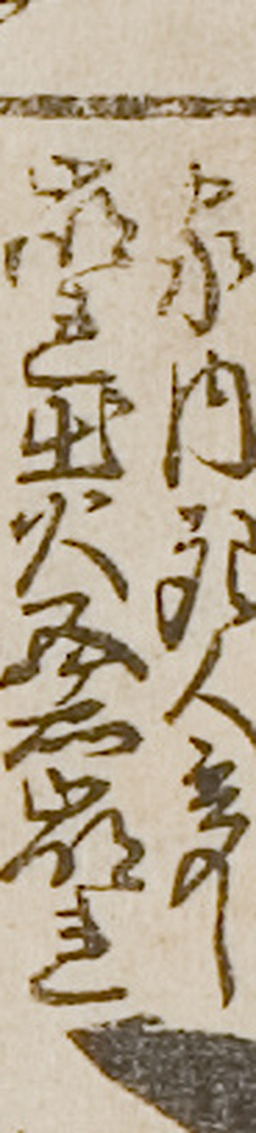崩れ出火五ヶ所崩れ
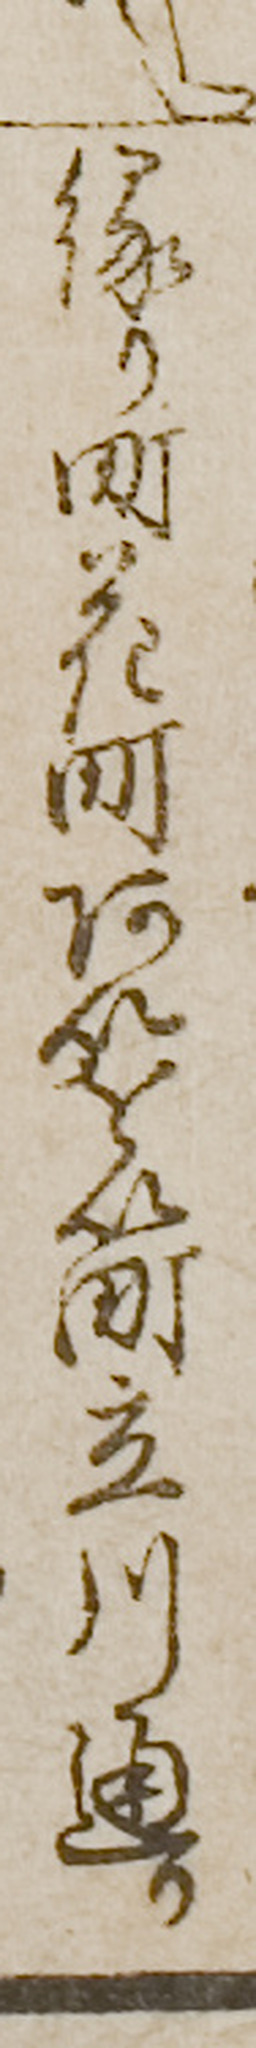縁り町花町あいをい町立川通り
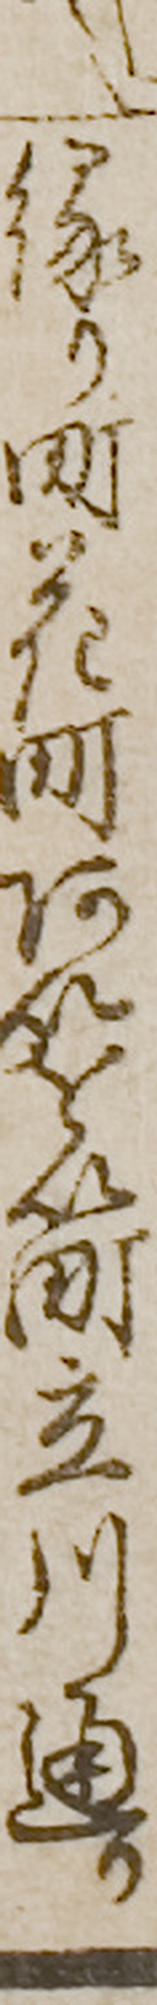縁り町花町あいをい町立川通り
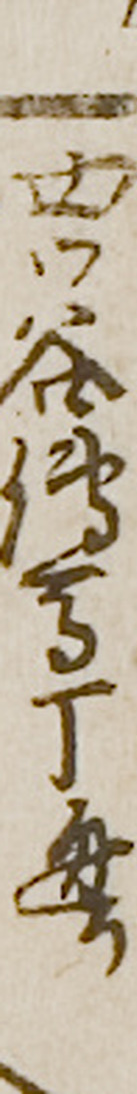四ッ谷伝馬丁通り
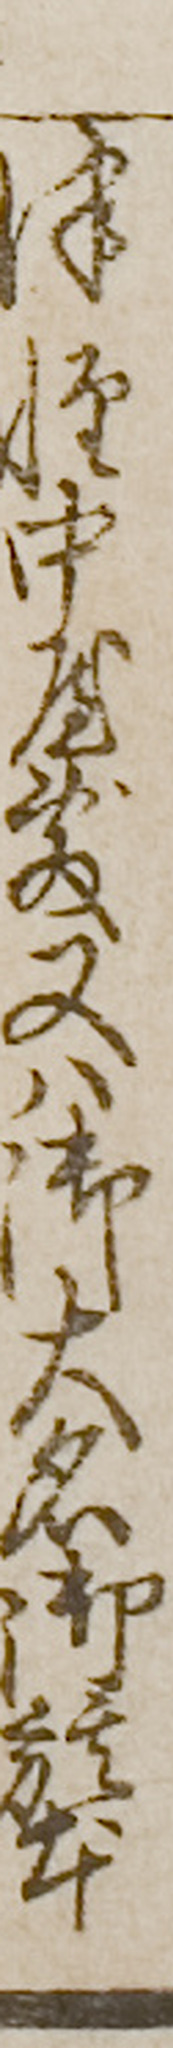津軽中屋敷又は御大名御旗本
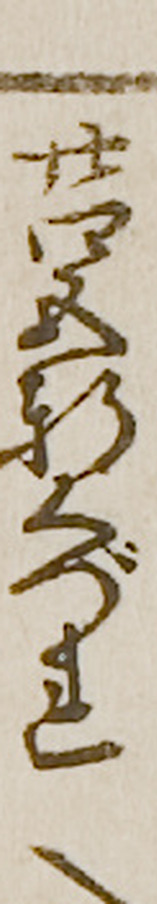廿四五軒くづれ
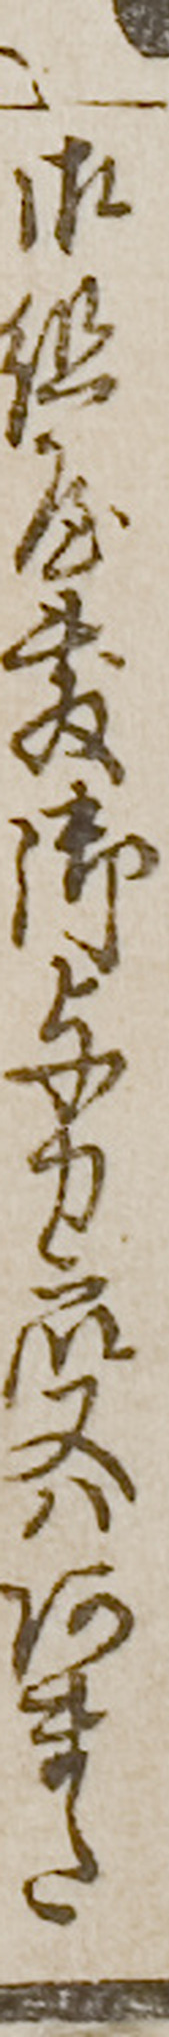御組屋敷御与力衆又はあまた
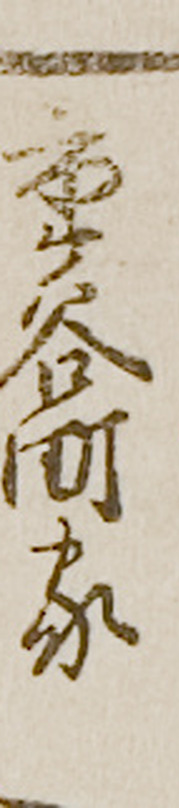市ヶ谷町家
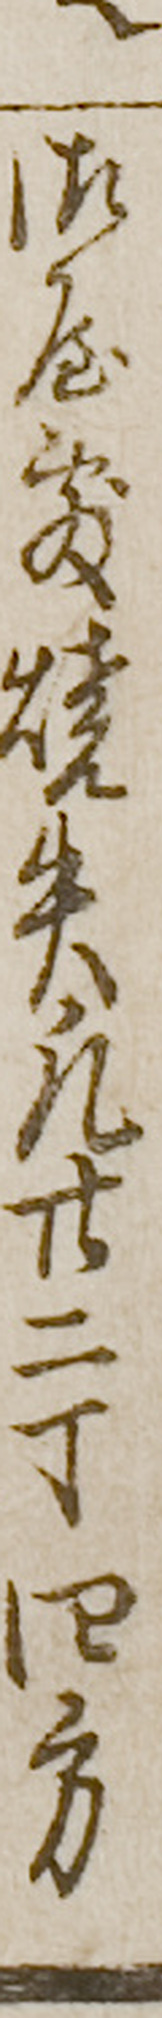御屋敷焼失凡廿二丁四方
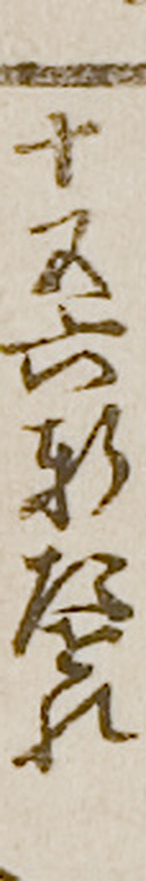十五六軒たをれ
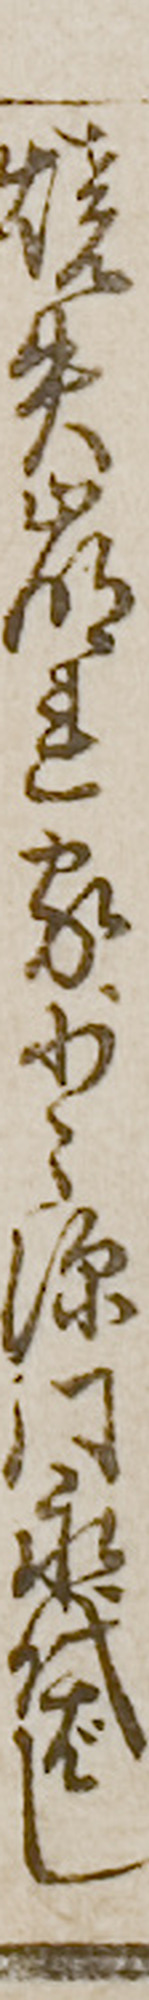焼失崩れ家少々深川永代ばし
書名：東都珍事実録咄
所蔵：東京大学総合図書館 General Library in the University of Tokyo, JAPAN
